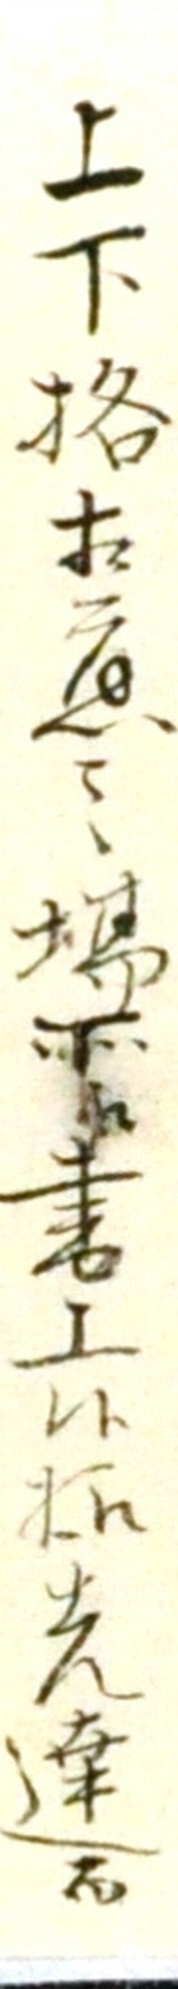上下格相応之場所江書上候様先達而
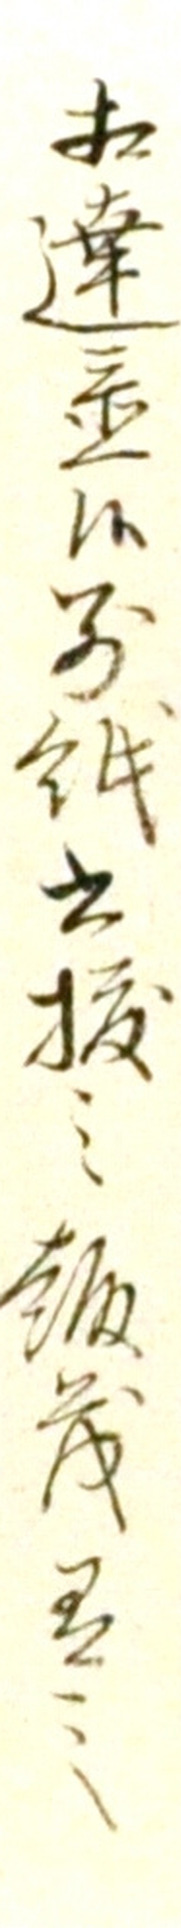相達置候別紙書抜之趣茂有之
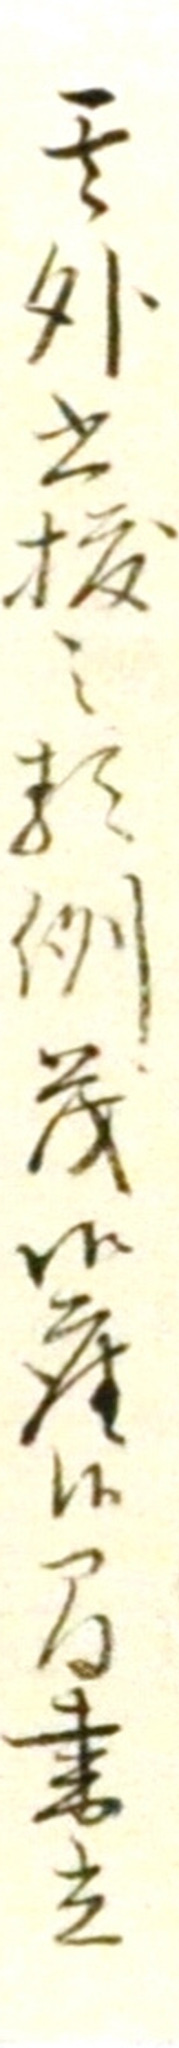其外書抜之類例茂御座候間書立
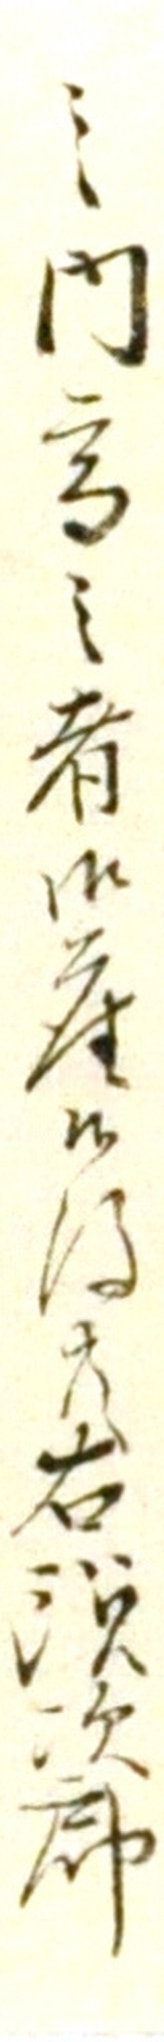之内高之者御座候得共右鋭次郎
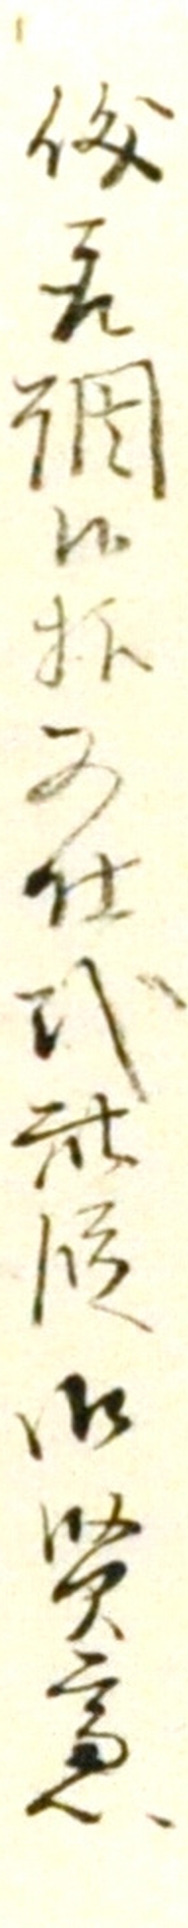儀取調候様可仕哉此段御賢慮
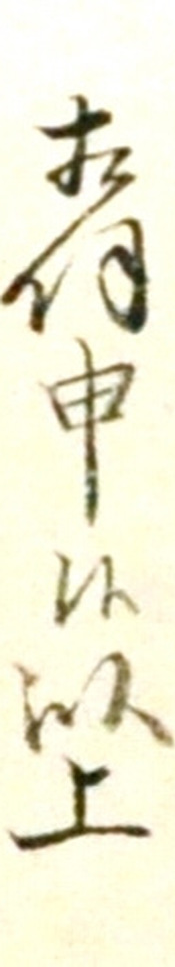相伺申候以上
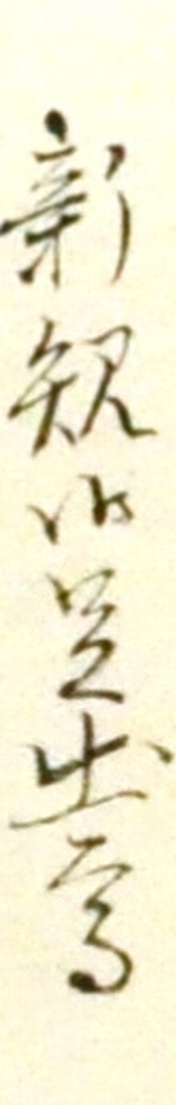新規候足出高

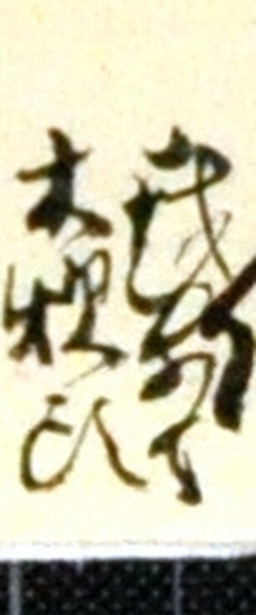大炊頭
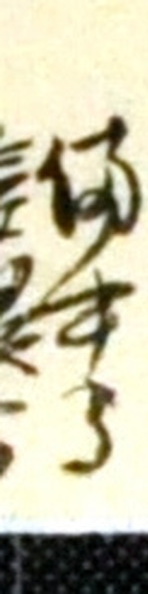備中守
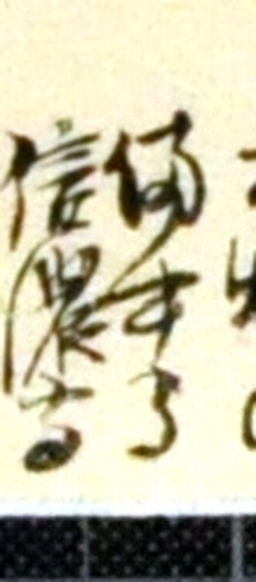信濃守
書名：西丸表火之番調
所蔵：伊那市立高遠町図書館・合同会社AMANE
